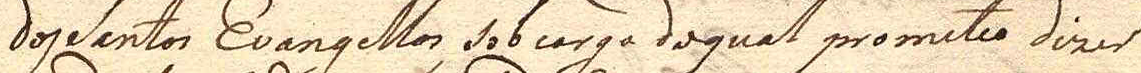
dos santos Evangelhos, sobcargo do qual pometeo dizer
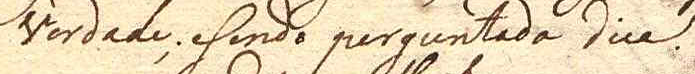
verdade; e sendo perguntada dice.
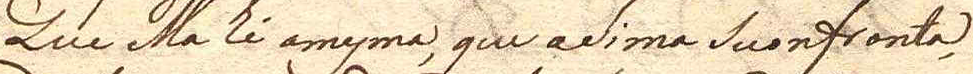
Que ella hé a mesma, que asima se confronta,
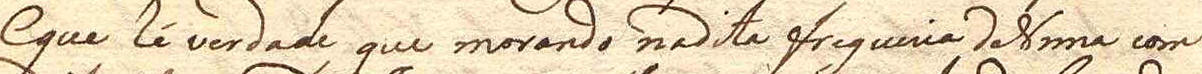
e que hé verdade, que morando na dita freguezia de Vnna com
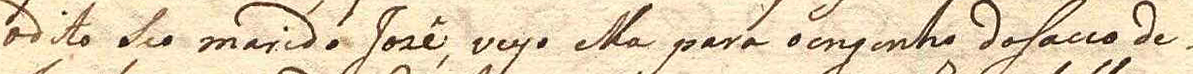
o dito Seo marido Jozê, veyo ella para o engenho do sacco de
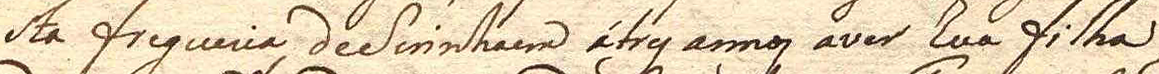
esta freguezia de Serinhaem á tres annos a ver hua filha
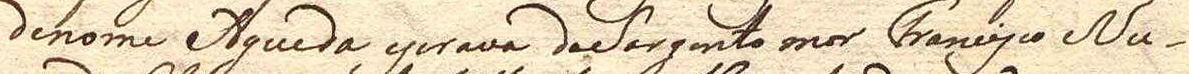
de nome Agueda escrava do Sargento mor Francisco Nu
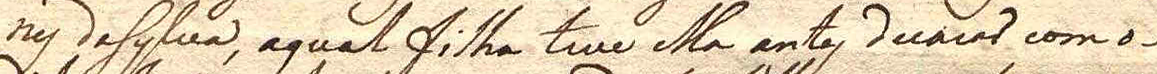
nes da sylva, a qual filha teve ella antes de cazar com o
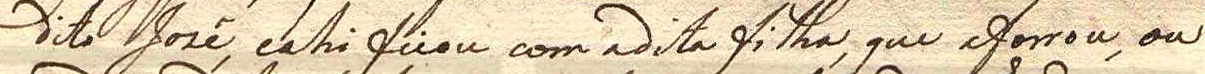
dito Jozê, e ahi ficou com a dita filha, que aforrou, ou
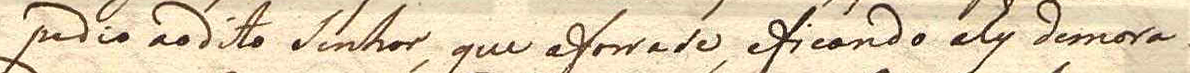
pedio ao dito senhor, que aforrase, e ficando ahy demora
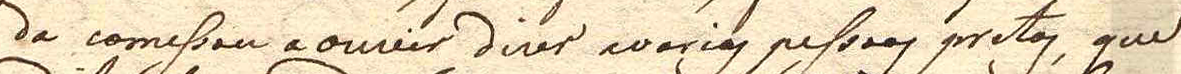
da comessou a ouvir dizer a varias pessoas pretos, que
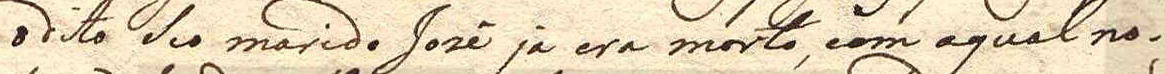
o dito seo marido Jozê ja era morto, com a qual no
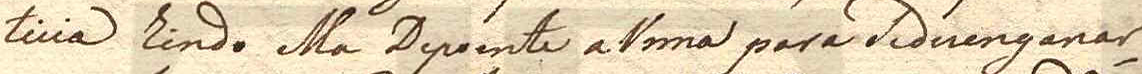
ticia hindo ella Depoente a Vnna para se dezenganar
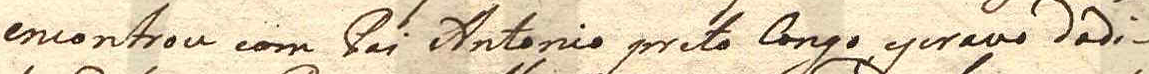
encontrou com Pai Antonio preto Congo escravo do di
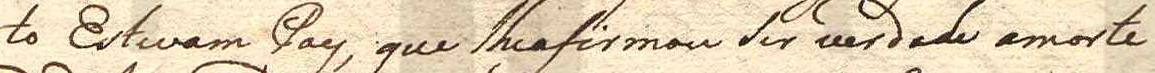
to Estevam Paes, que lhe afirmou ser verdade a morte
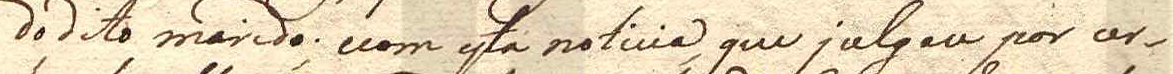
do dito marido; e com esta noticia, que julgou por cer
